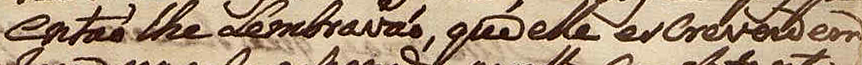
Entaõ lhe Lembravaõ, que elle escreveu em
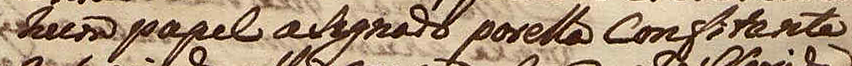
hum papel asignado por ella Confitente
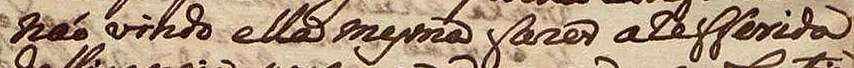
naõ vindo ella mesma fazer a Refferida
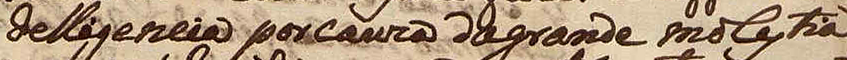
delligencia por cauza da grande molestia
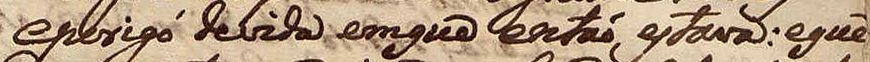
e perigo de vida em que entaõ estava: e que
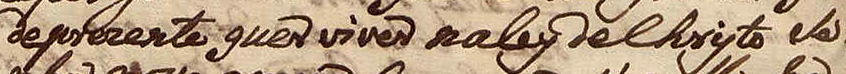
de prezente quer viver na ley de Christo se
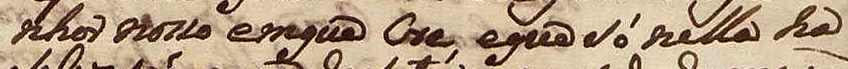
nhor nosso em que cre, e que só nella ha
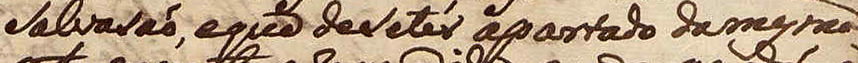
salvasaõ, e que de se ter apartado da mesma
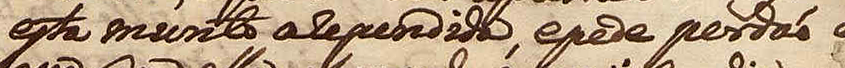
esta munto aRependida, e pede perdaõ
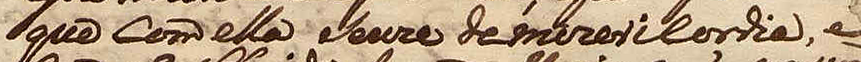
que com ella se uze de mizericordia, e
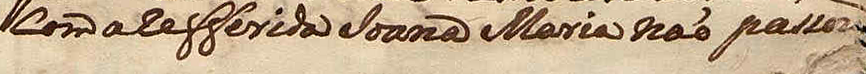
Com a Refferida Ioana Maria naõ passou
